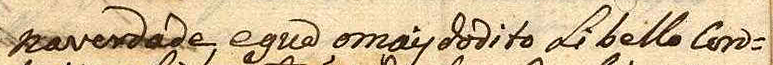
na verdade, e que o mais do dito Libello Con
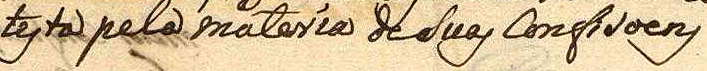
testa pela materia de suas Confisoens
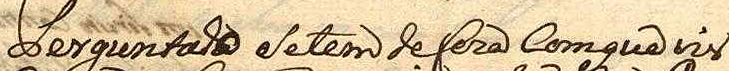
Perguntada se tem defeza com que vir
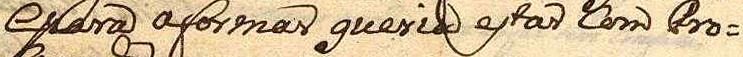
E para a formar queria estar com Pro
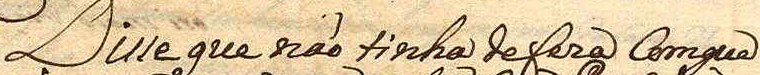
Disse que naõ tinha defeza com que
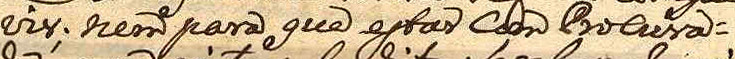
vir; nem para que estar com Procura
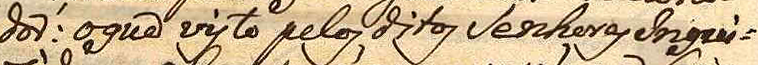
dor: o que visto pelos ditos senhores Inqui
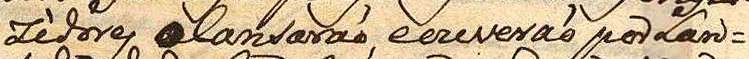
zidores o lansaraõ, e ouveraõ por Lan
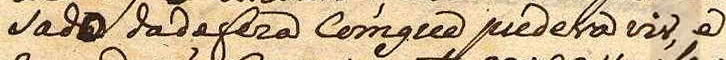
sado da defeza com que pudera vir, e
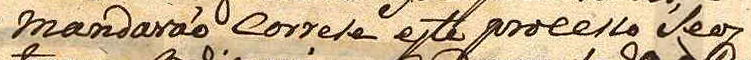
mandaraõ Correse este processo seos
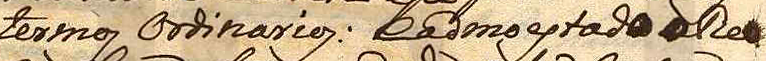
termos, Ordinarios: e admoestado a Reo
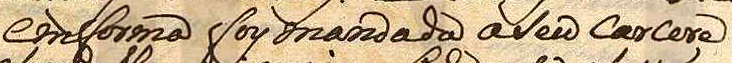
em forma foy mandada a seu carcere
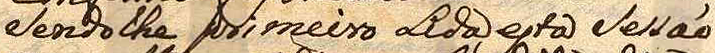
sendolhe primeiro Lida esta Sessaõ
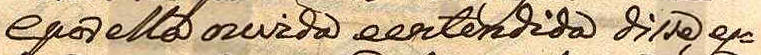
e por ella ouvida e entendida disse es
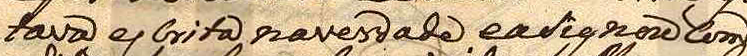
tava escrita na verdade e asignou com
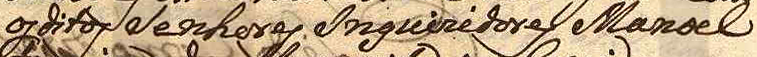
os ditos Senhores Inquizidores Manoel
